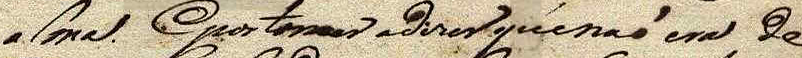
alma. e por tornar a dizer que naõ era de
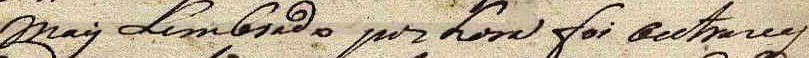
mais Lembrado por hora foi outra ues
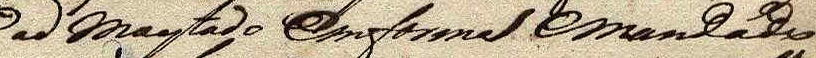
admoestado em forma e mandado
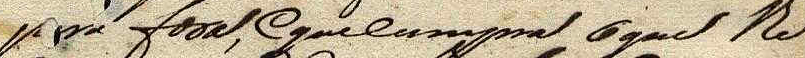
p_ra fora, e que cumpra o que lhe
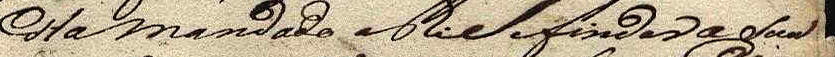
esta mandado athi se findar a sua
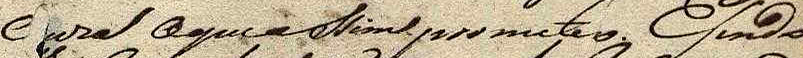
c_uza o que assim prometeo. E sendo
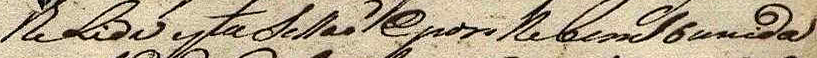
lhe Lida esta Sessaõ e por elle bem ouvida
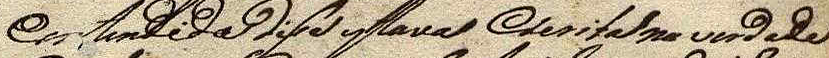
e entendida disse estava escrita na verdade
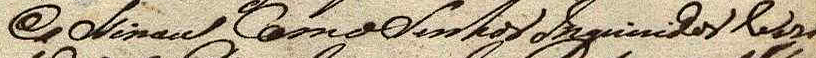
e assinou Com o Senhor Inquizidor Vesi
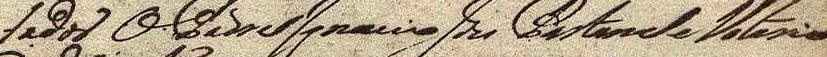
tador O Padre Ignacio Joze Pastana Notario
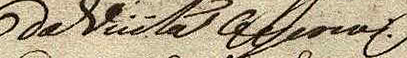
da Visita o escrevi.
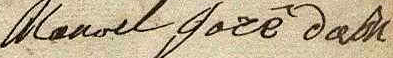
Manoel Jozê da M
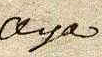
aya
